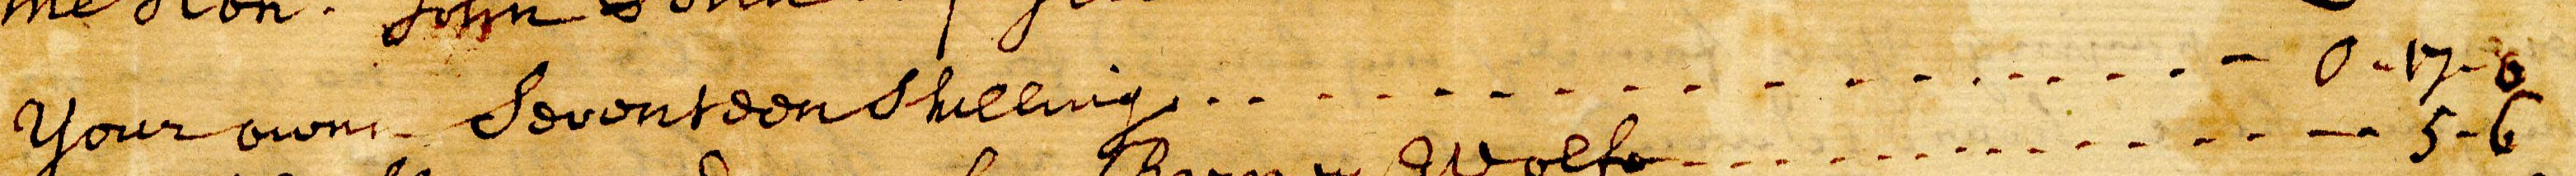Your own Seventeen Shilling...................0.17.0
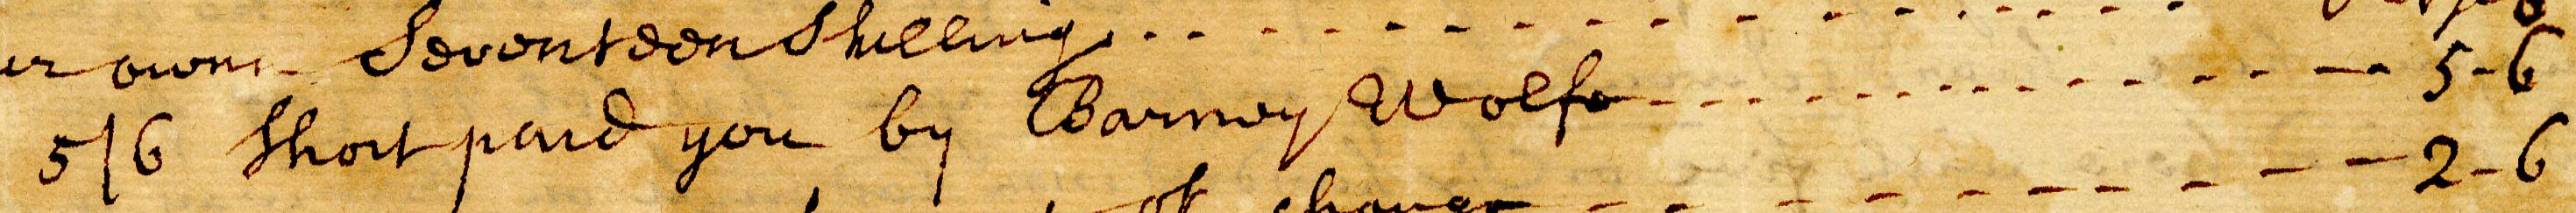5s6 Short paid you by Barney Wolfe...............5.6
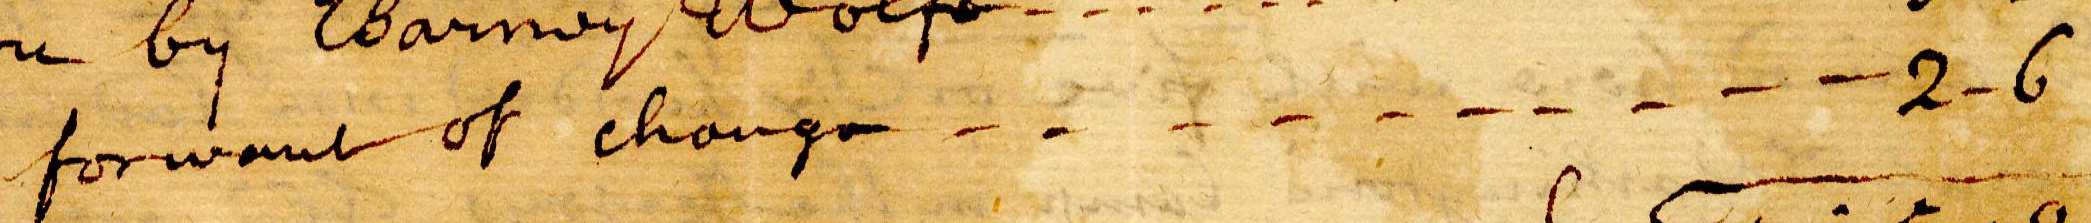for want of change----------2.6
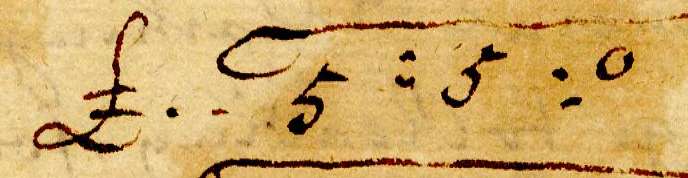£..5..5..0
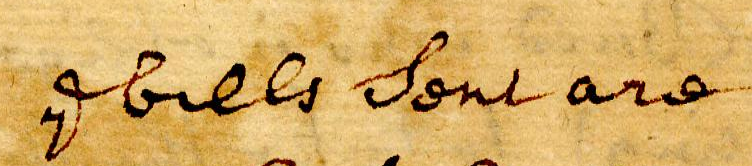y^e bills sent are
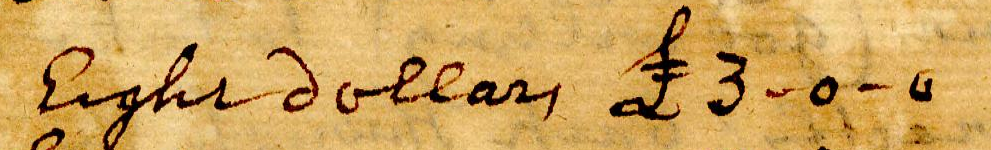English dollars £3.0.0
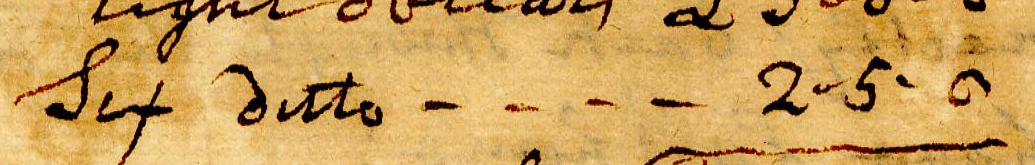Six ditto ---- 2.5.0
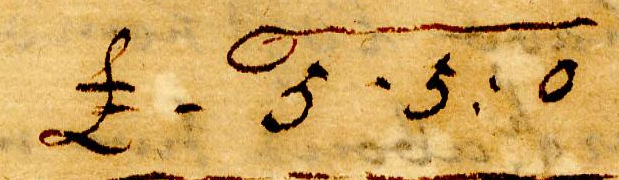£. 5.5..0
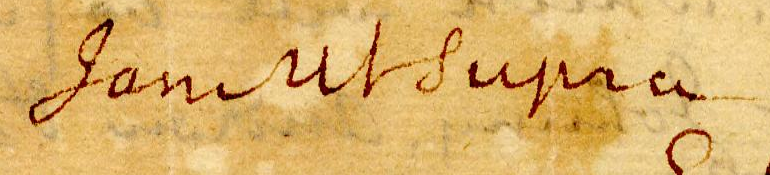I am ut supra
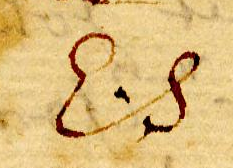E.S
